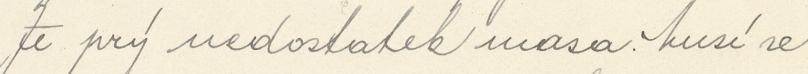Je prý nedostatek masa. Musí se
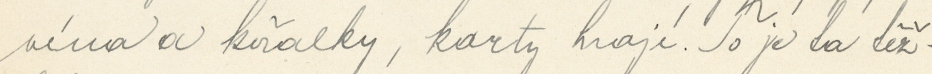vína a kořalky, karty hrají. To je ta těž-
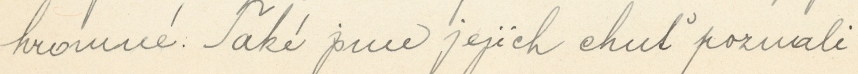hromné. Také jsme jejich chuť poznali.
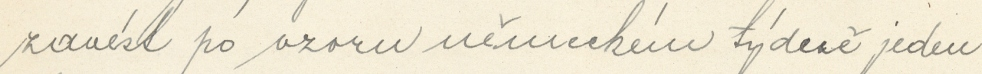zavést po vzoru německém týdně jeden
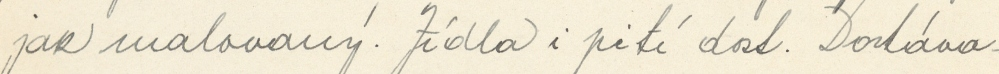jak malovaný. Jídla i pití dost. Dostáva-
